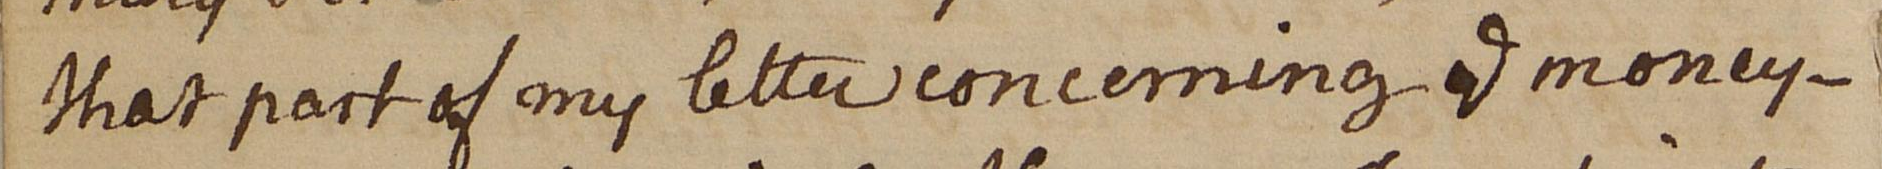that part of my letter concerning y^e money-
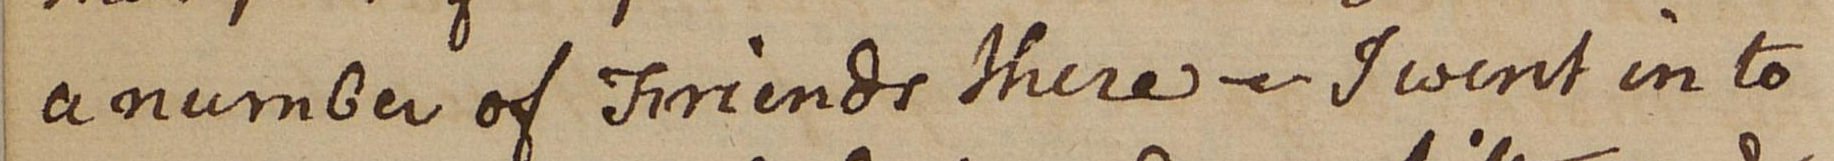a number of Friends there- I went in to
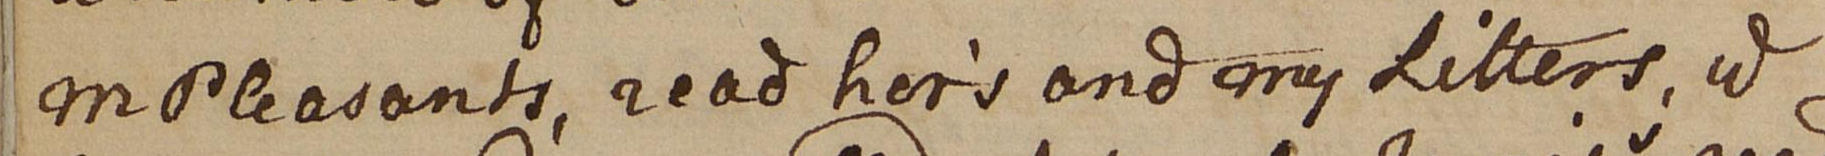M Pleasants, read her's and my Litters, y^e
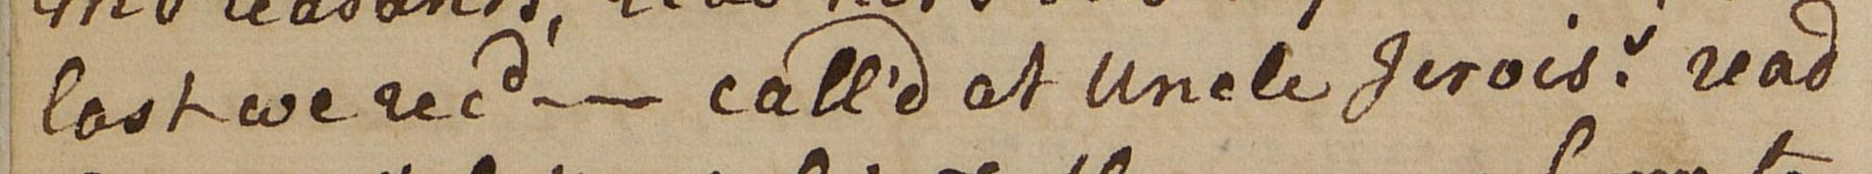last we rec^d- call'd at Uncle Jervis^s. read
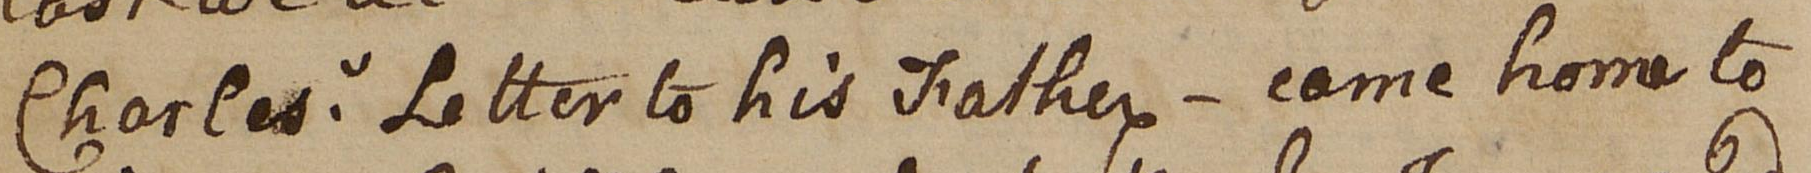Charles^s. Letter to his Father- came home to
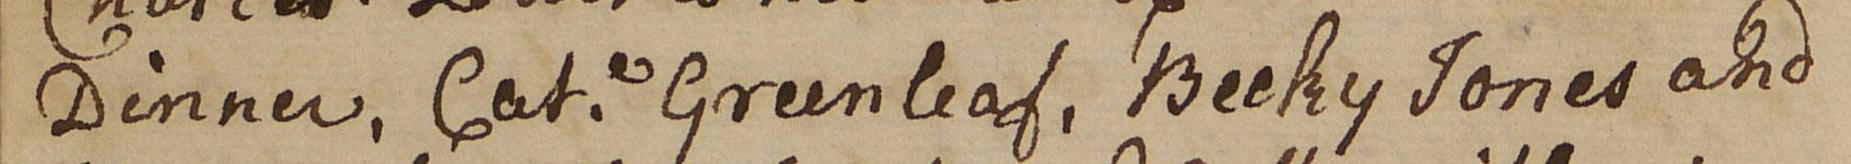Dinner, Cat^l. Greenleaf, Becky Jones and
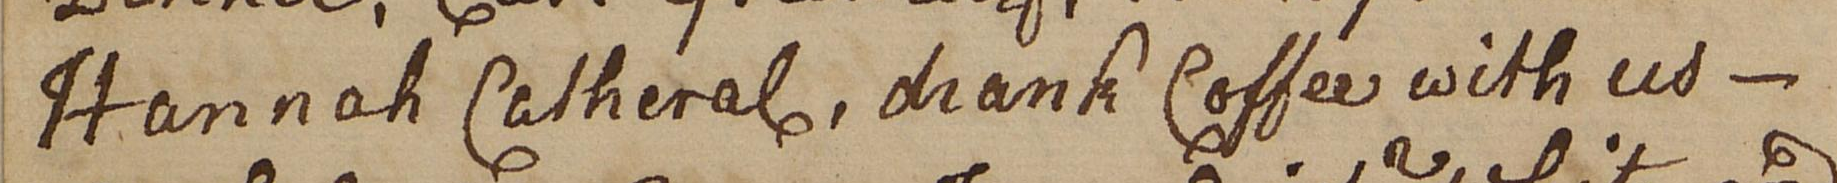Hannah Catheral, drank Coffee with us-
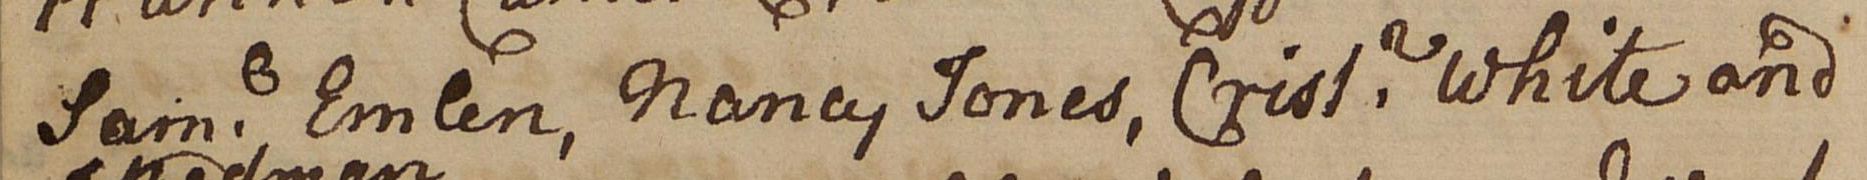Sam^l. Emlen, Nancy Jones, Crist^r. White and
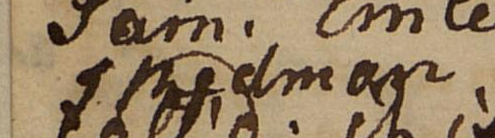J. Redman
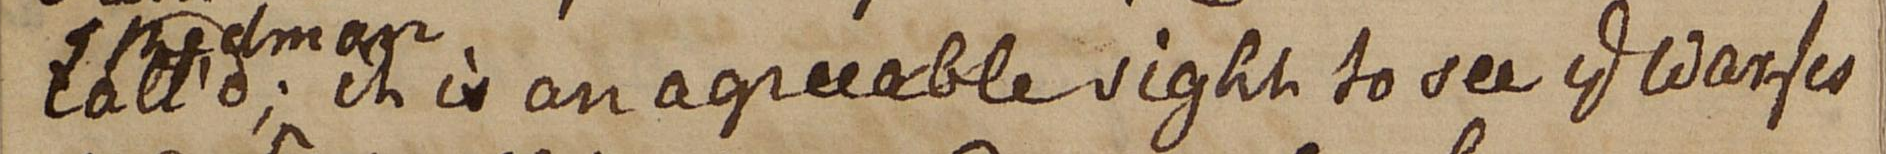call'd; ^ it is an agreeable sight to see y^e Warfes
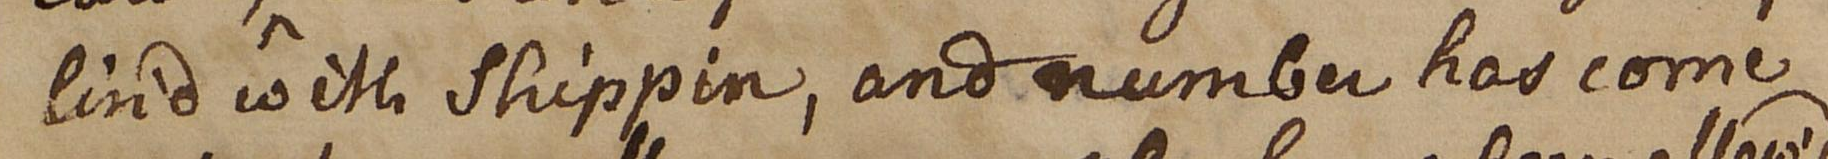lin'd with Shippin, and number has come
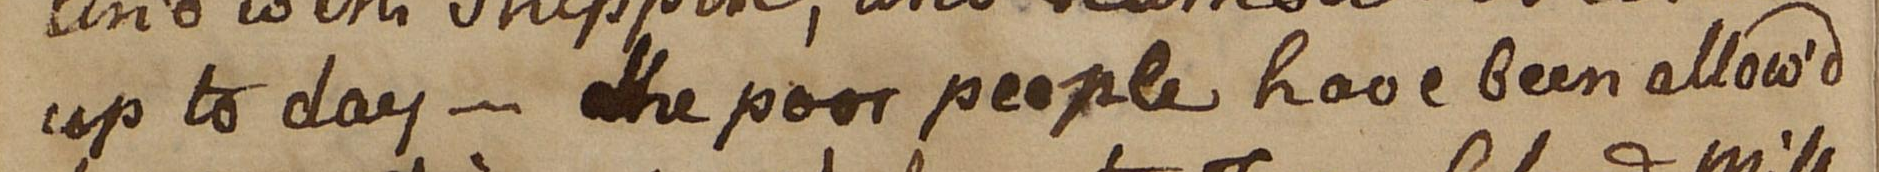up to day- the poor people have been allow'd
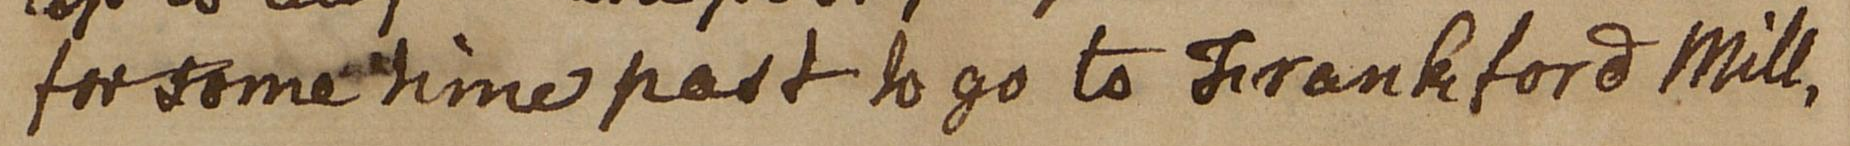for some time past to go to Frankford Mill,
